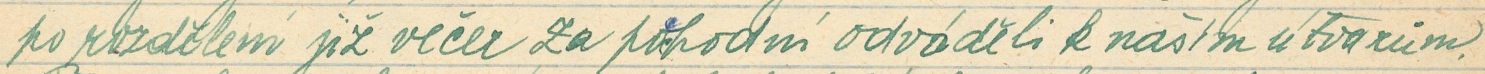po rozdělení již večer za pochodní odváděli k naším útvarům.
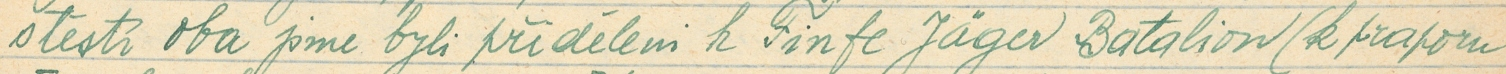štěstí oba jsme byli přiděleni k Finfe Jäger Batalion (k praporu
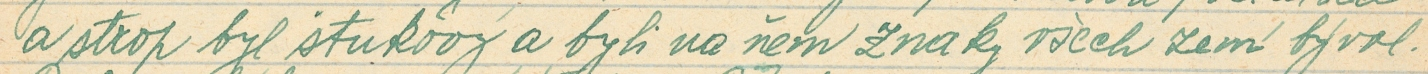a strop byl štukový a byli na ňem znaky všech zemí býval.
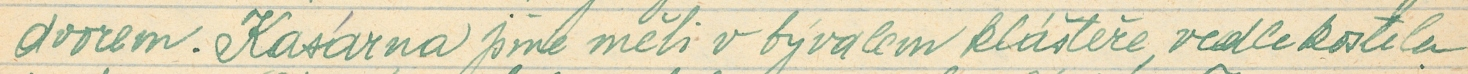dvorem. Kasárna jsme měli v bývalem klášteře, vedle kostela
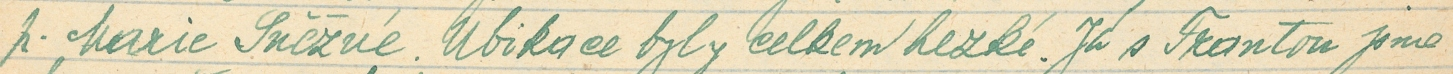p. Marie Sněžné. Ubikace byly celkem hezké. Já s Frantou jsme
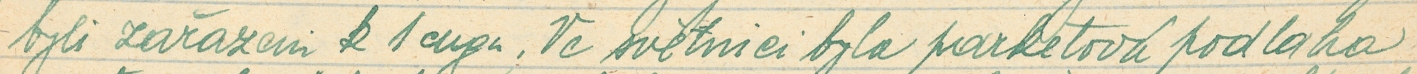byli zařazeni k 1 cugu. Ve světnici byla parketová podlaha
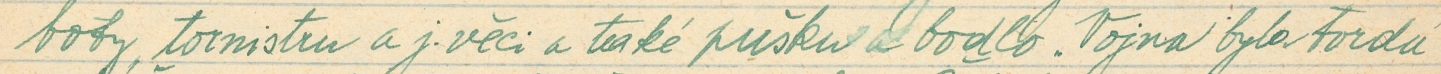boty, tornistru a j. věci a také pušku a bodlo. Vojna byla tvrdá
